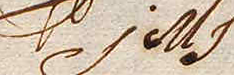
jMj
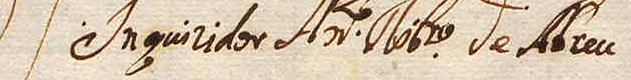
Sor Inquizidor An.to Ribr.o de Abreu
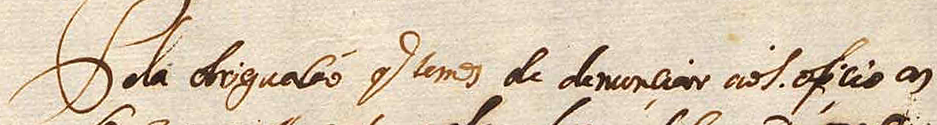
Pela obriguaÇaõ q̄ temos de denunciar ao S. officio as
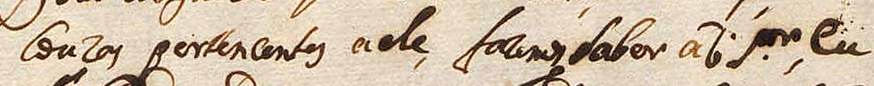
Couzas pertencentes a ele, fazemos saber a V. s.as, Eu
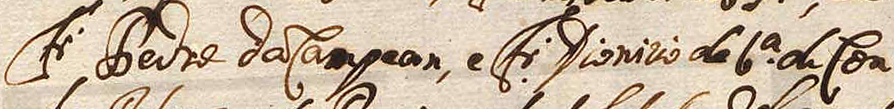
Fr. Pedro da Campean, e fr Dionizio de V.a de Con
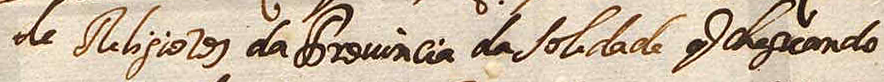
de Religiozos da Prouincia da Soledade q̄ cheguando
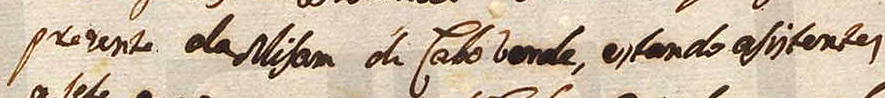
prezente da Misam de Cabo verde, estando asistentes
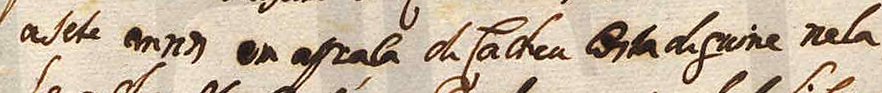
a sete annos em a praÇa de Cacheu Costa de guine nela
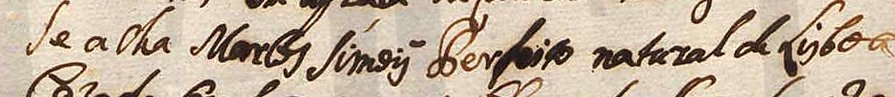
se acha MarCos Simois̄ Perfeito natural de Lisboa
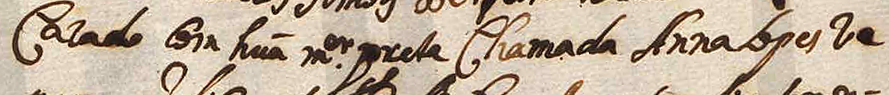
Cazado com huā me.r preta Chamada Anna Lopes Ve
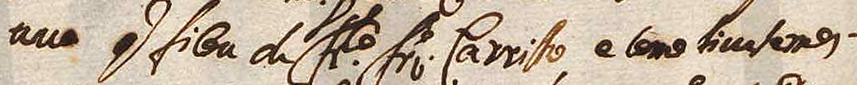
uua q̄ ficou de Fr.co frz. Carrilho, e como tiuesemos
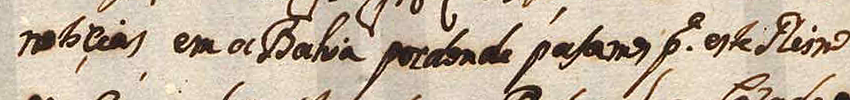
notiçias em a Bahia por donde pasamos p.a este Reino
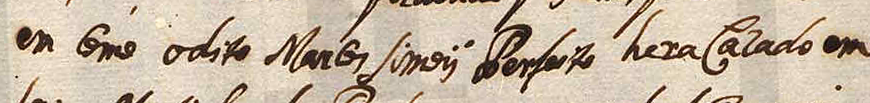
em Como o dito MarCos Simois̄ Perfeito hera Cazado em
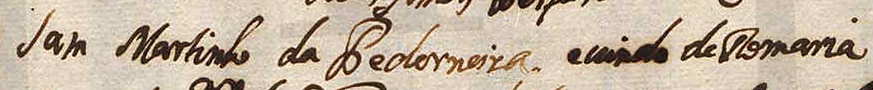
Sam Martinho da Pederneira, e uindo de Romaria
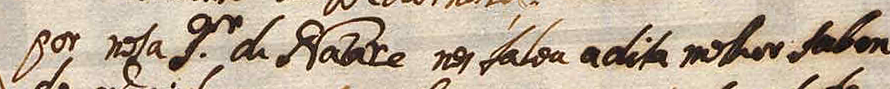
por nosa s.ra de NaZare nos falou a dita molher saben
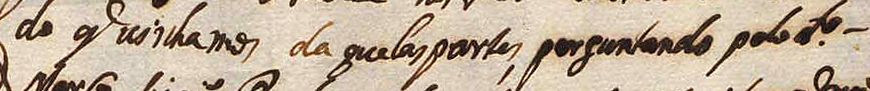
do q̄ uinhamos daquelas partes, perguntando pelo d̄.o
